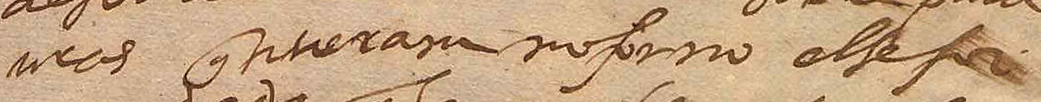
uras q̄ tiueram no forno e lhe foi
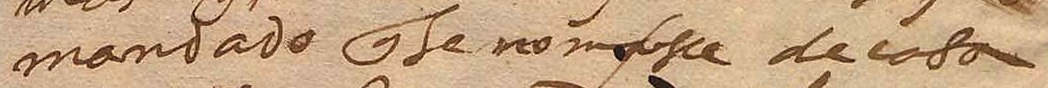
mandado q̄ se nom fosse de casa
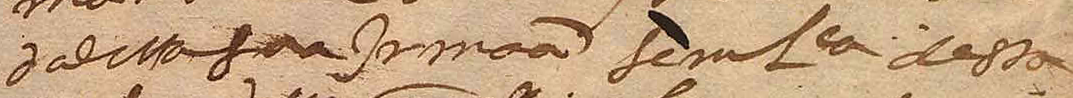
da ditta sua Jrmaã sem Lca desta
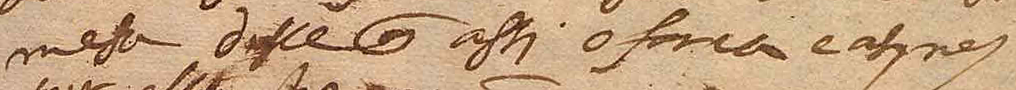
mesa disse q̄ assi o faria e asjnej
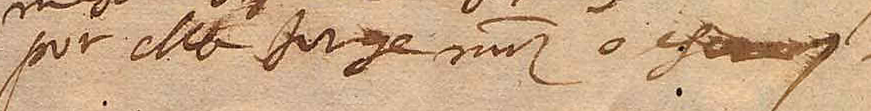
por ella Jorge mīz o escrevy
